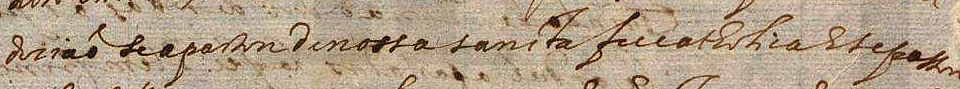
diziaõ se apartou de nossa sancta fee catholica E se passou
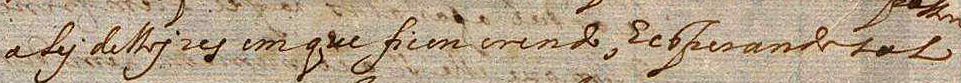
a lej de Mojzes em que ficou crendo, E esperando sal
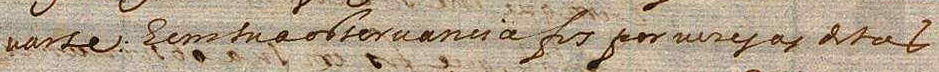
uarse. E em sua obseruancia fes por uezes as ditas
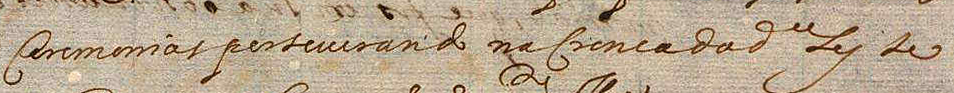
Ceremonias perseuerando na Crença da da Lej de
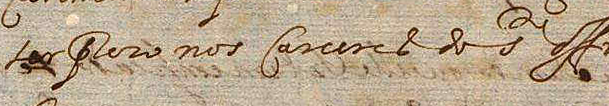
ser prezo nos Carceres do sto offo
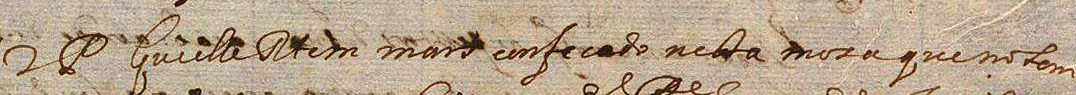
2 P Que elle R tem mais confeçado nesta meza que no tem
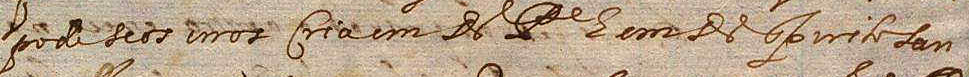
po de seos erros Cria em Ds̄ Pe E em Ds̄ spirito san
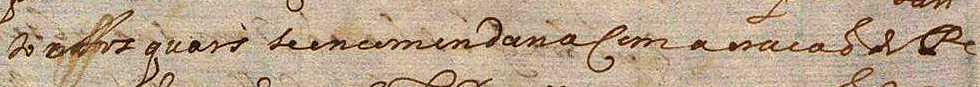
to Aos quais se encomendaua Com a oraçaõ de Pe
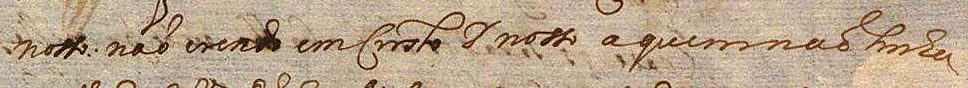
nosso naõ crendo em Cristo S̄ nosso a quem naõ tinha
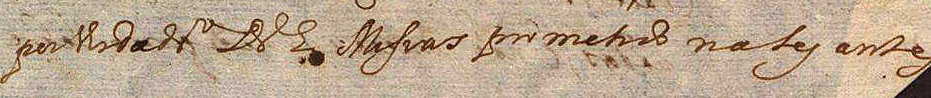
per Verdadro Ds̄ E Mesias prometido na lej antes
